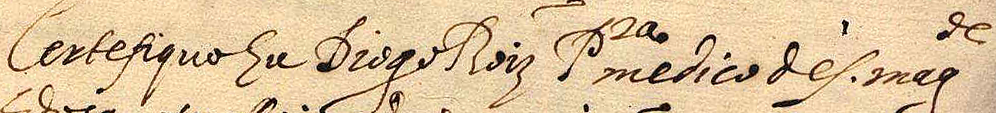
Certefiquo Eu Diogo Roiz̄ Pra medico de s. magde
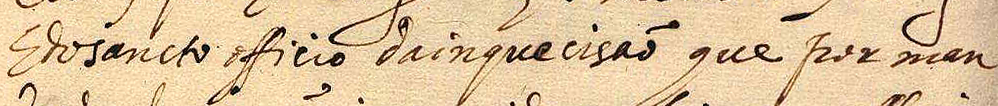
E do sancto officio da inquecisaõ que por man
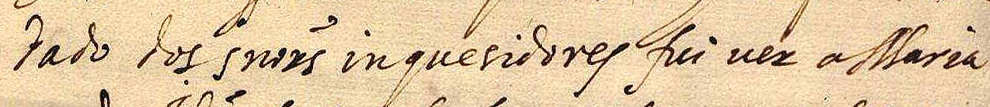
dado dos snors̄ inquesidores fui uer a Maria
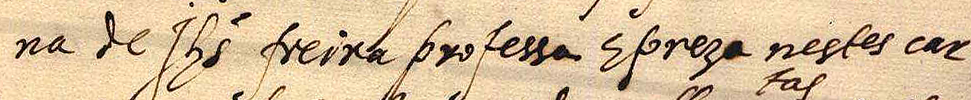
na de Jhs̄ freira professa E preza nestes car
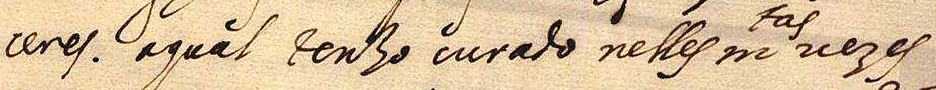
ceres. a qual tenho curado nelles mtas uezes
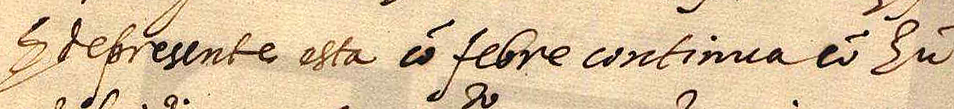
E de presente esta cō febre continua cō hū
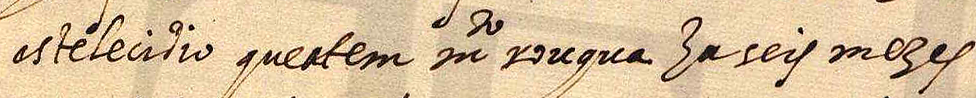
estelecidio que a tem mto rouqua ha seis mezes
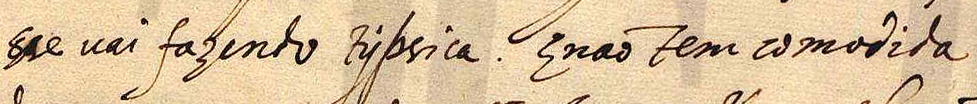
E se uai fazendo typsica. E naõ tem comodida
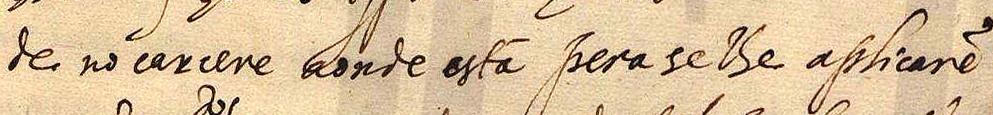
de no carcere aonde está pera se lhe aplicarē
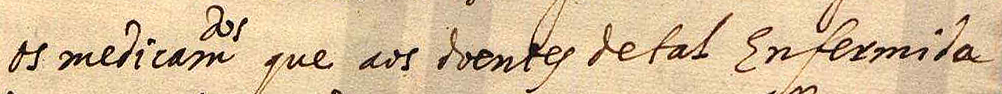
os medicamtos que aos doentes de tal Enfermida
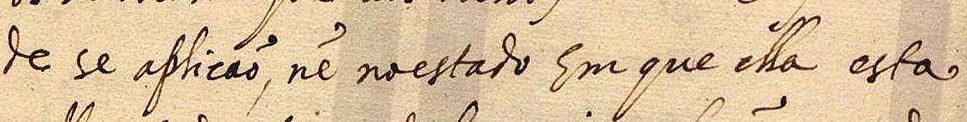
de se aplicão, nē no estado Em que ella esta
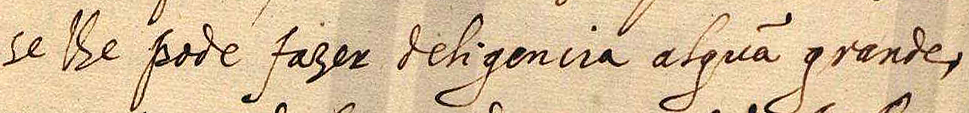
se lhe pode fazer deligencia alguā grande,
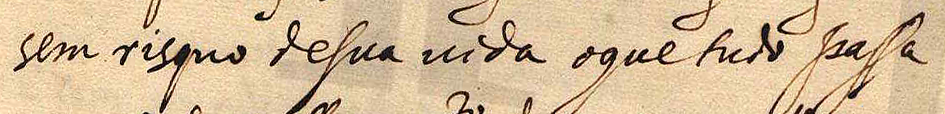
sem risquo de sua uida o que tudo passa
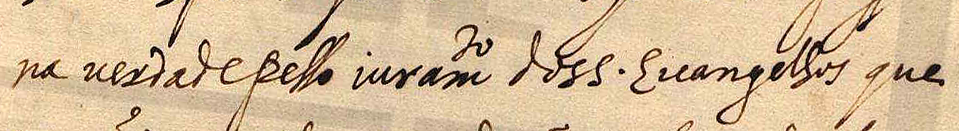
na uerdade pello iuramto dos s. Euangelhos que
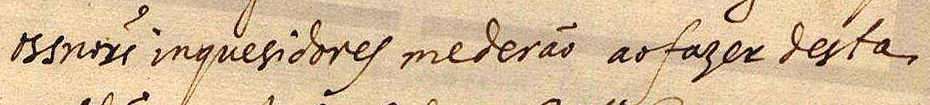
os snors̄ inquesidores me deraõ ao fazer desta
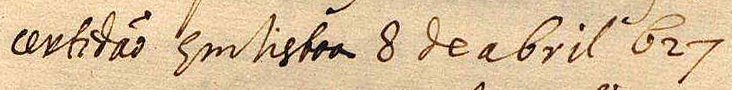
certidão Em lisboa 8 de abril 627
